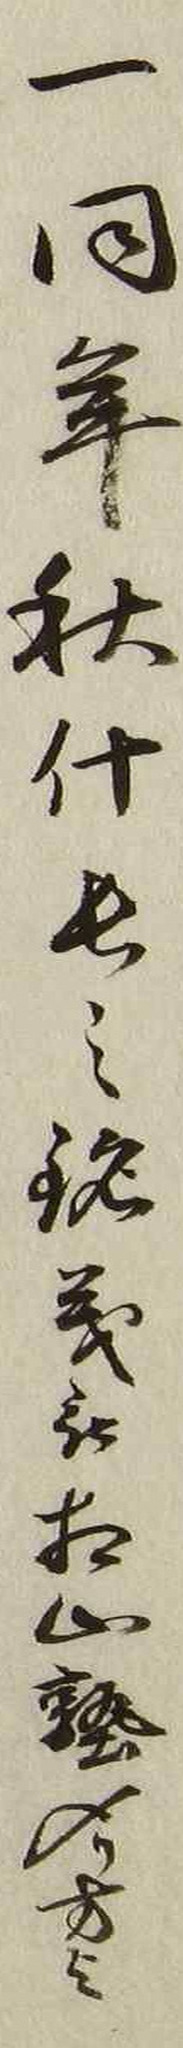一同年秋什長之銘義被相止塾〆り方と
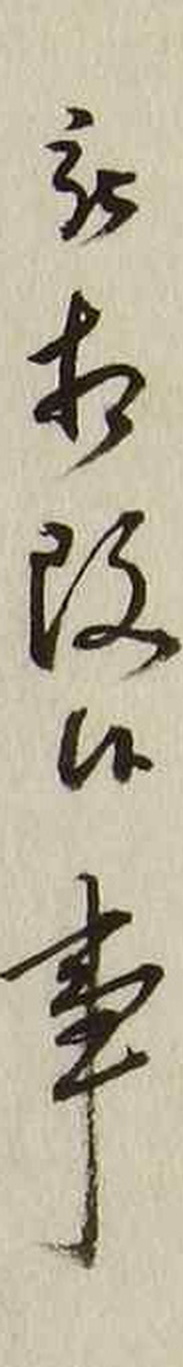被相改候事
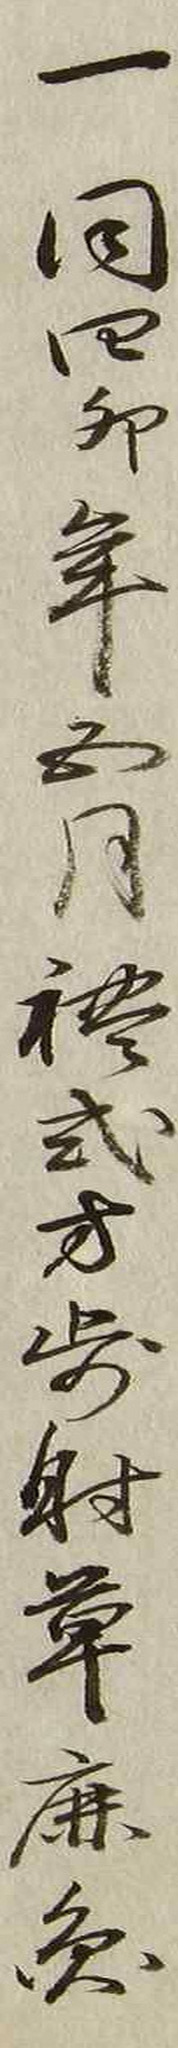一同四卯年五月礼式方歩射草鹿円
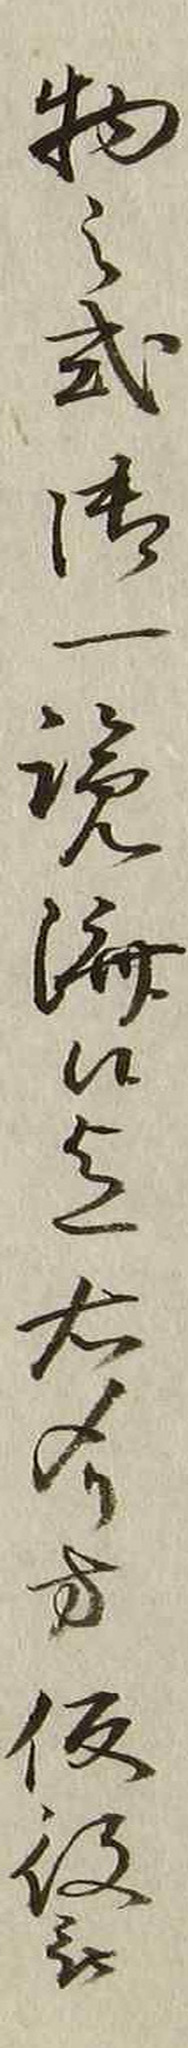物之式御一覧済候迄右〆り方仮役被
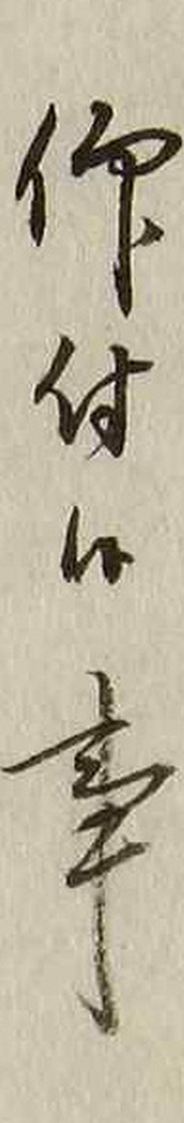仰付候事
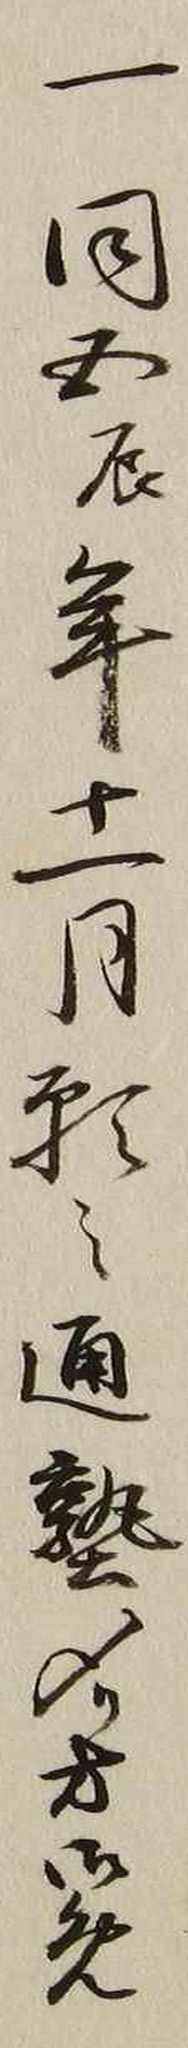一同五辰年十一月願之通塾〆り方御免
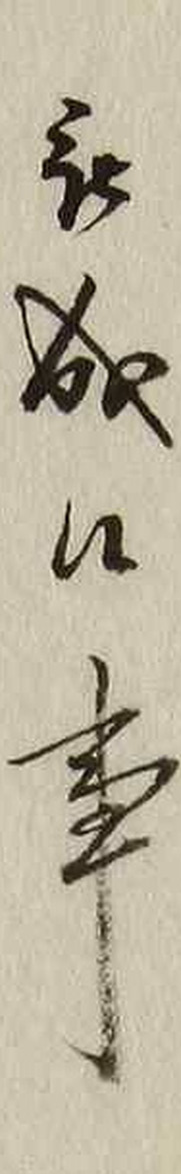被成候事
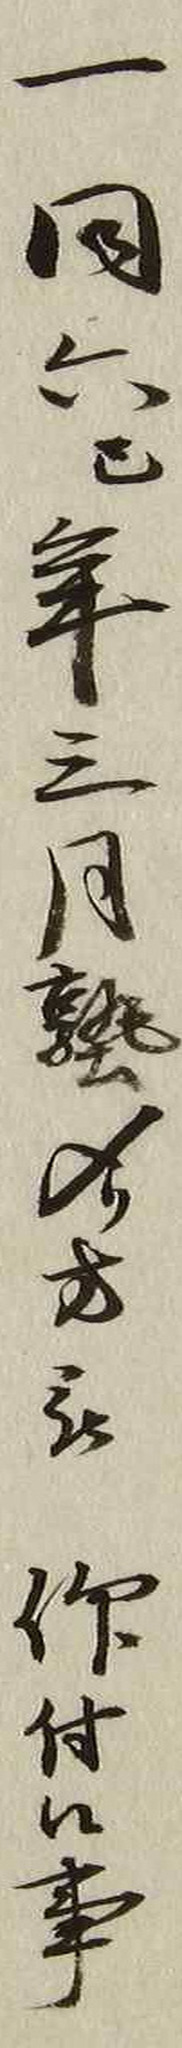一同六巳年三月塾〆り方被仰付候事
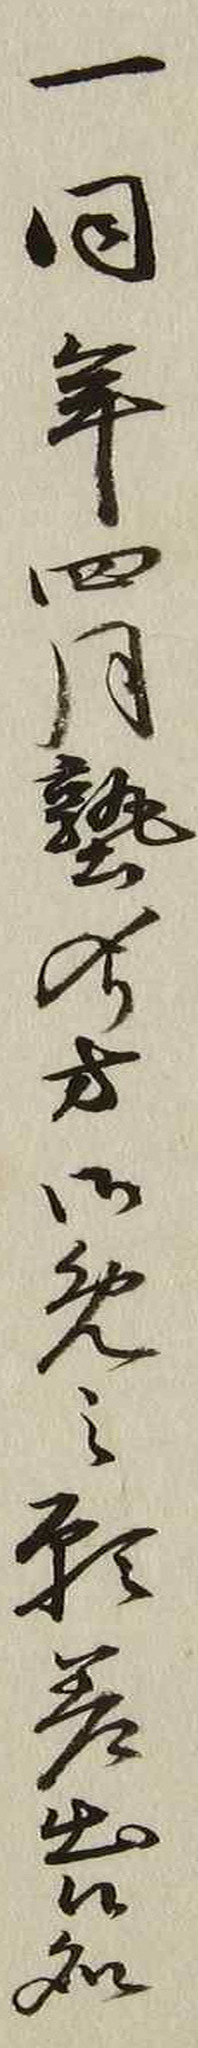一同年四月塾〆り方御免之願差出候処
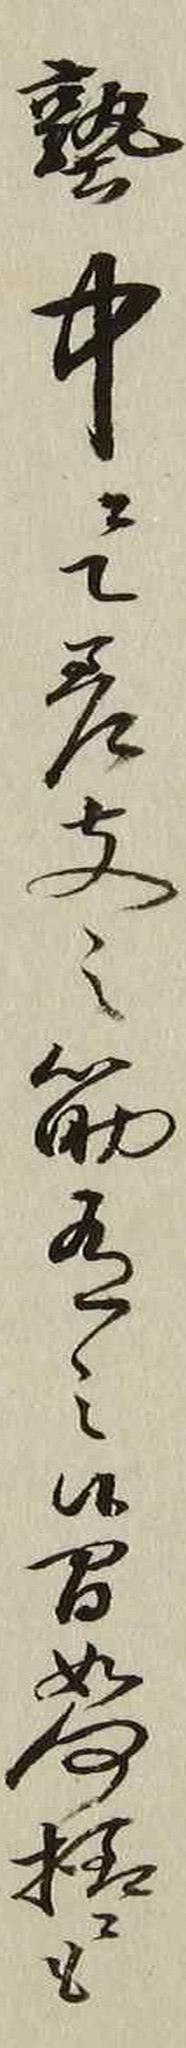塾中ニ而差支之筋有之候間如何様ニも
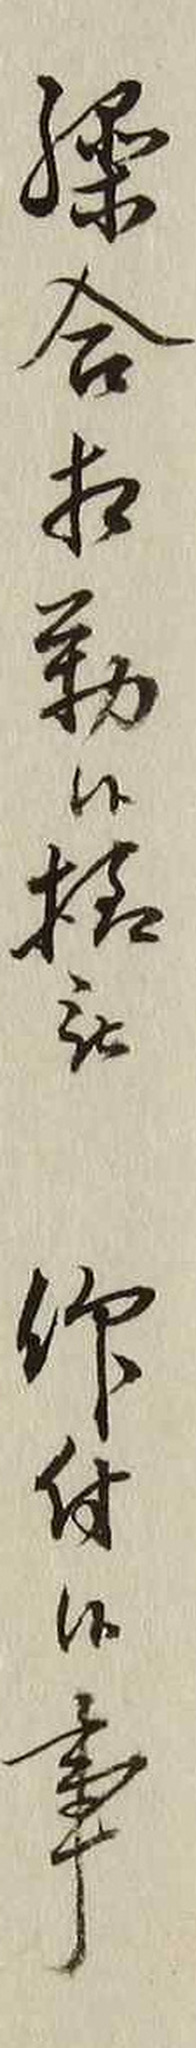繰合相勤候様被仰付候事
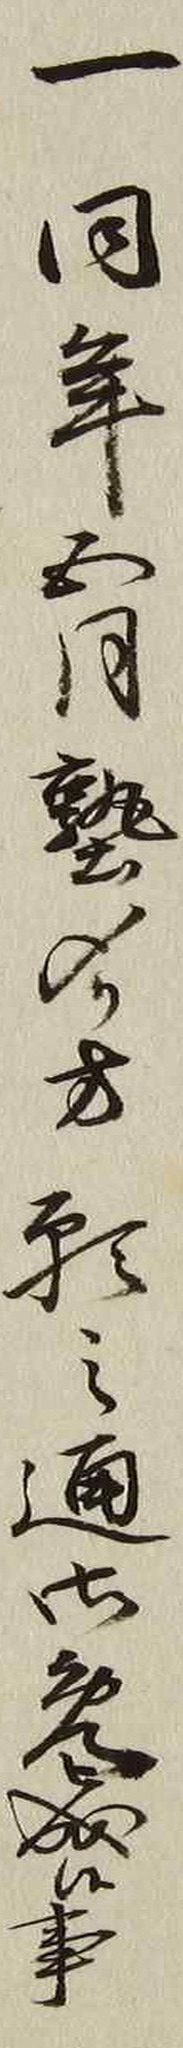一同年五月塾〆り方願之通御免被成候事
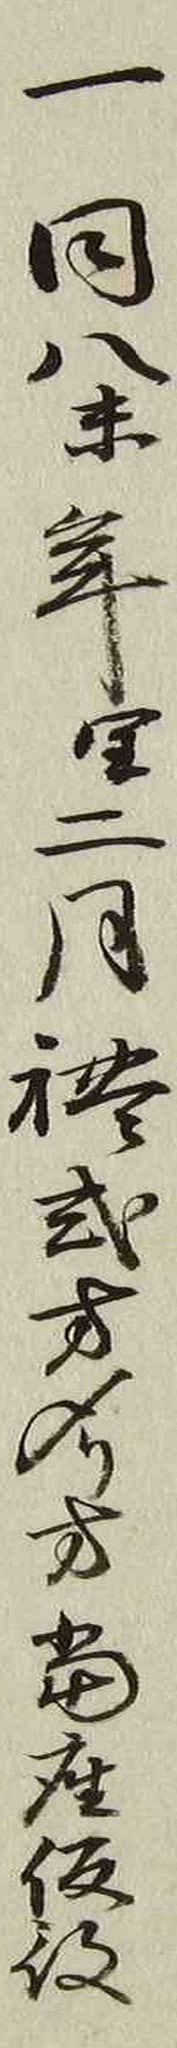一同八未年閏二月礼式方〆り方当座仮役
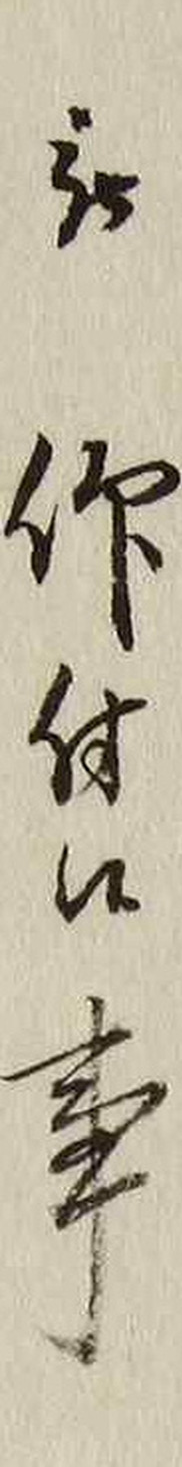被仰付候事
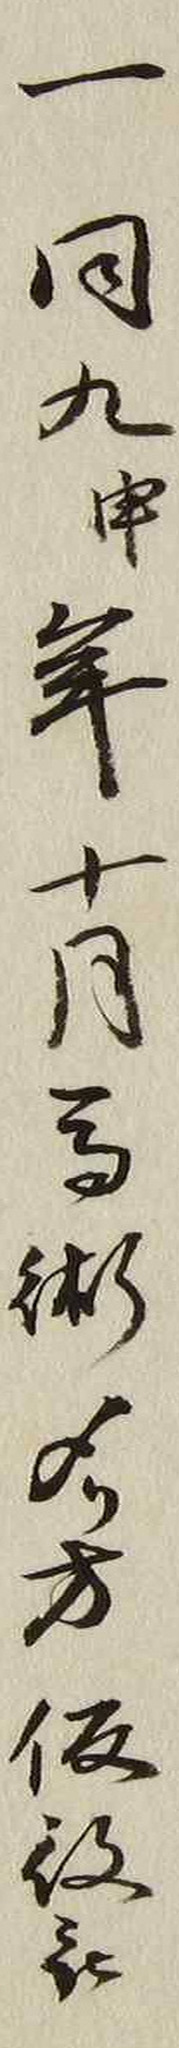一同九申年十月馬術〆り方仮役被
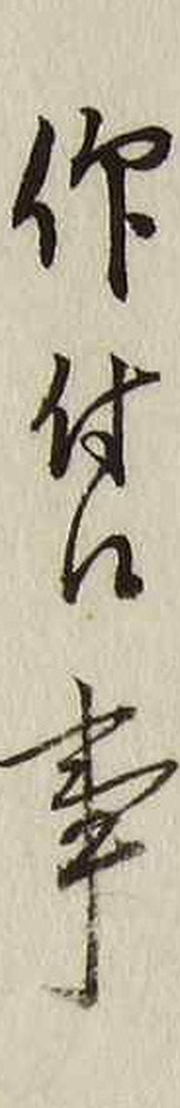仰付候事
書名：諸士系譜　巻之160　な之部2
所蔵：会津若松市立会津図書館
